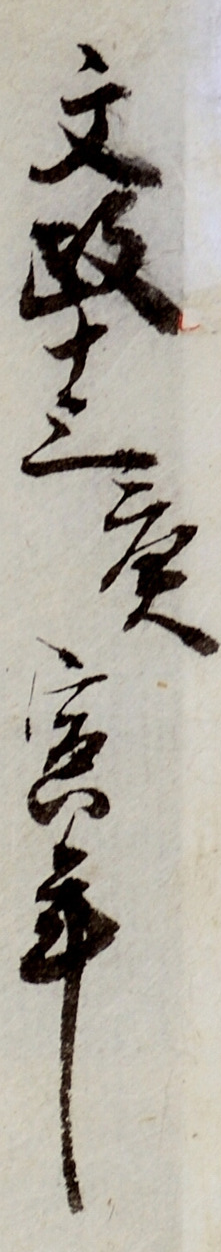文政十三庚寅年
